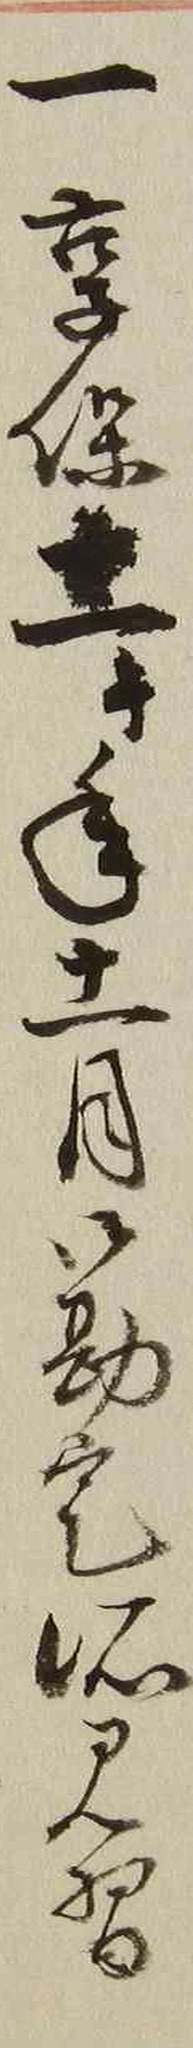一享保十一午年十一月御勘定所見習
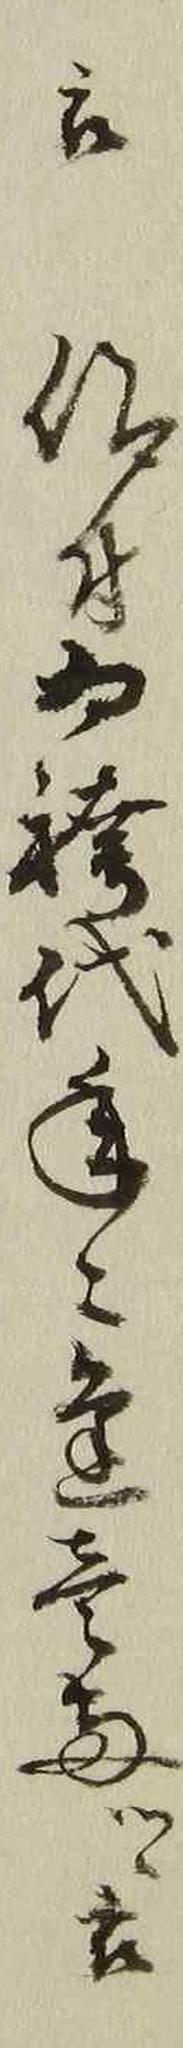被仰付為袴代年々金壱両ツヽ被
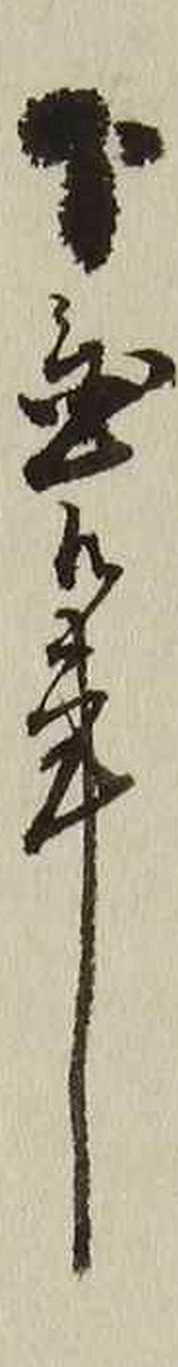下置候事
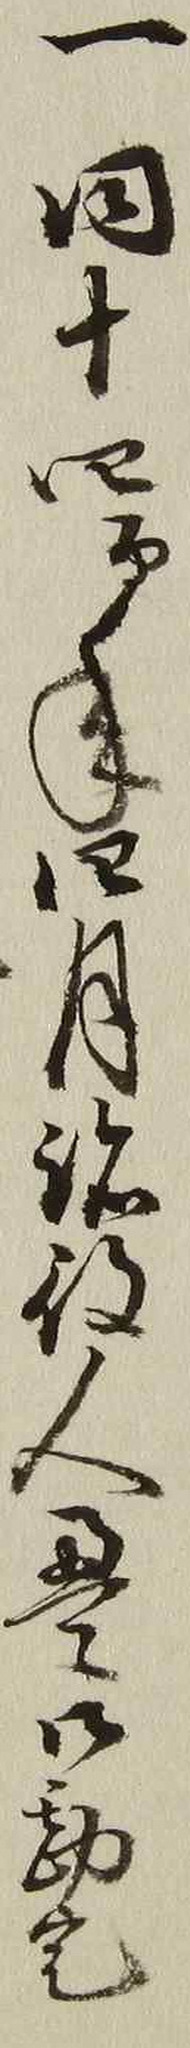一同十四酉年四月諸役人畳御勘定
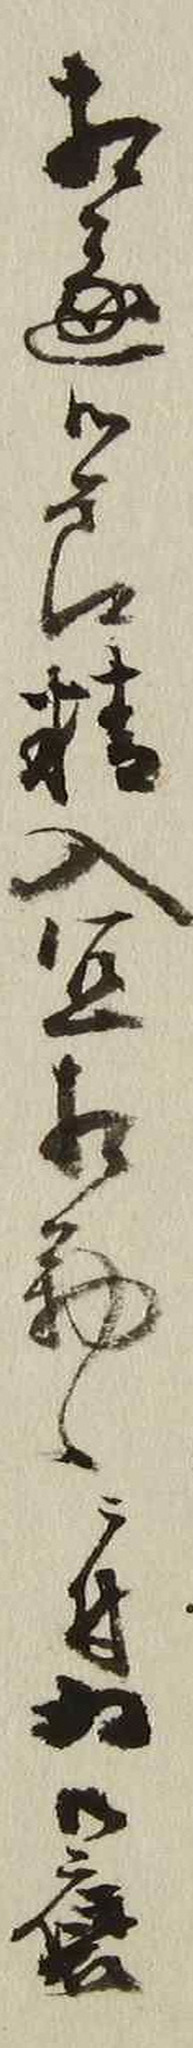相遂候節精入宜相勤候ニ付為御褒
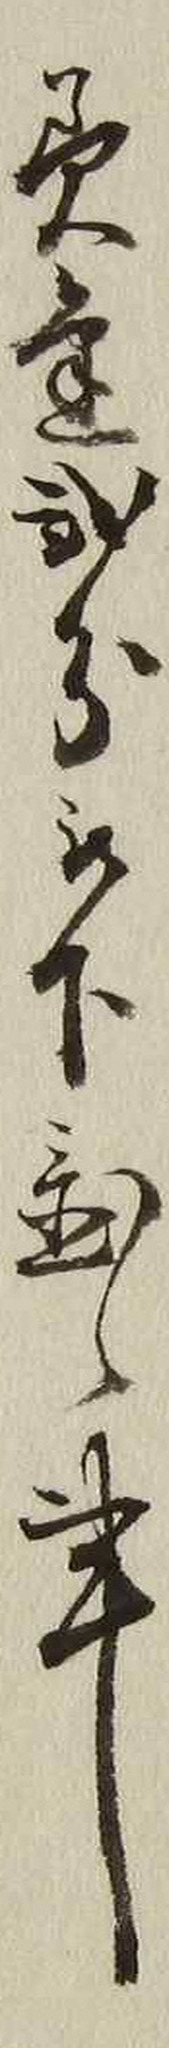美金弐分被下置候事
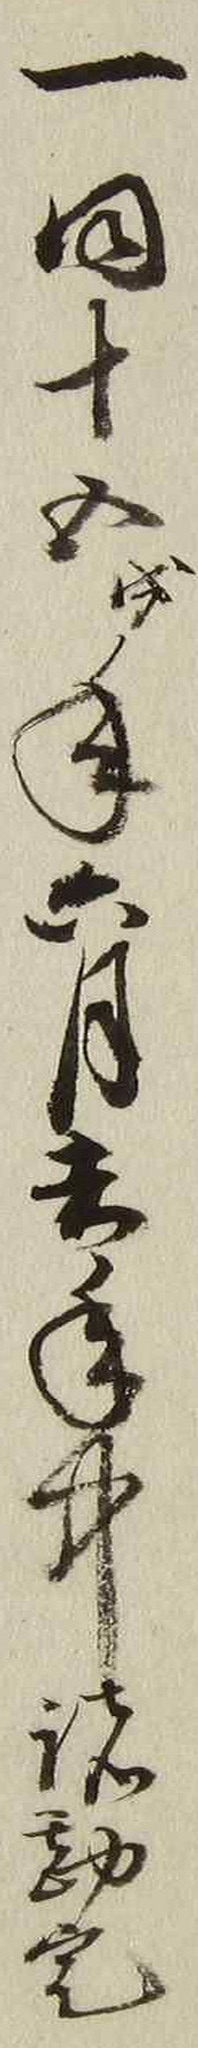一同十五戌年六月去年中諸勘定
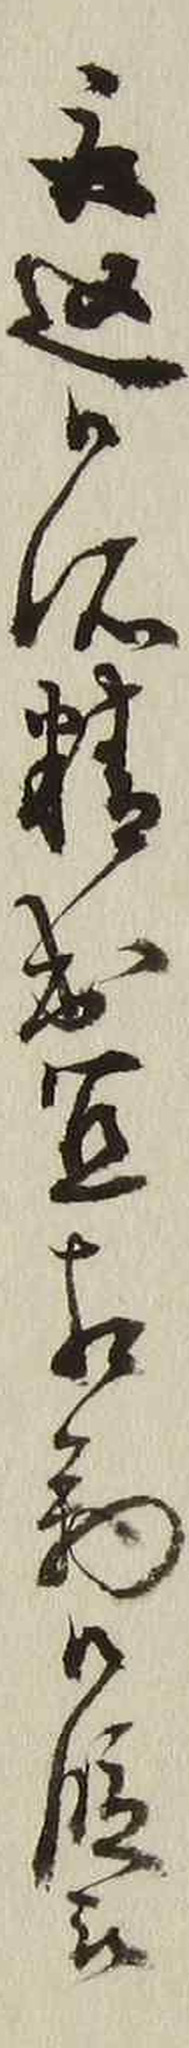取込候所精出宜相勤候段被
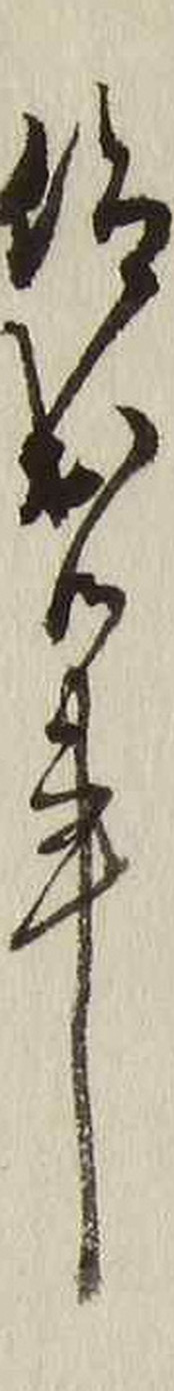仰出候事
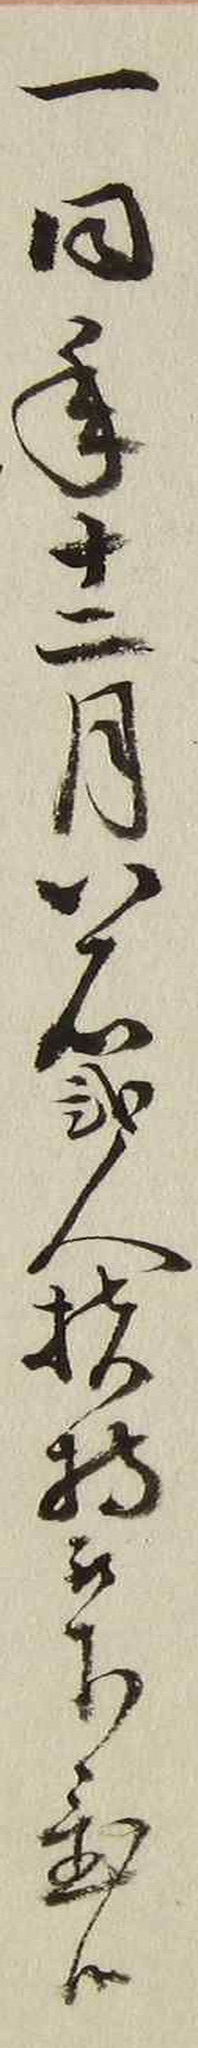一同年十二月八石弐人扶持被下置候
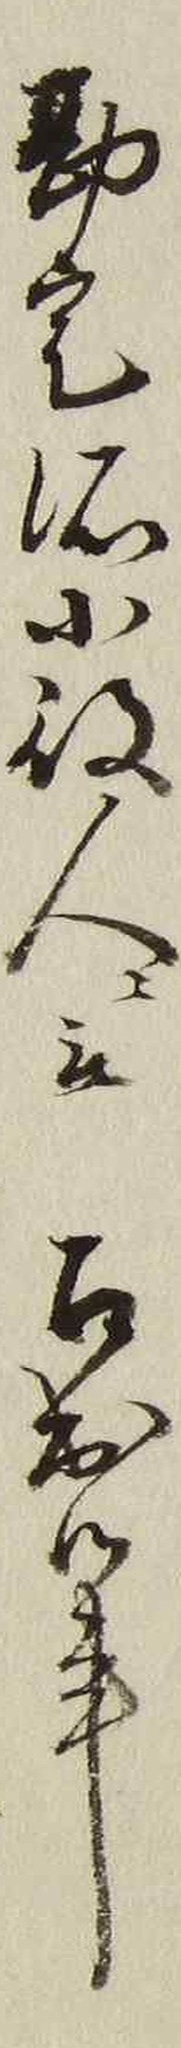勘定所小役人ニ被召出候事
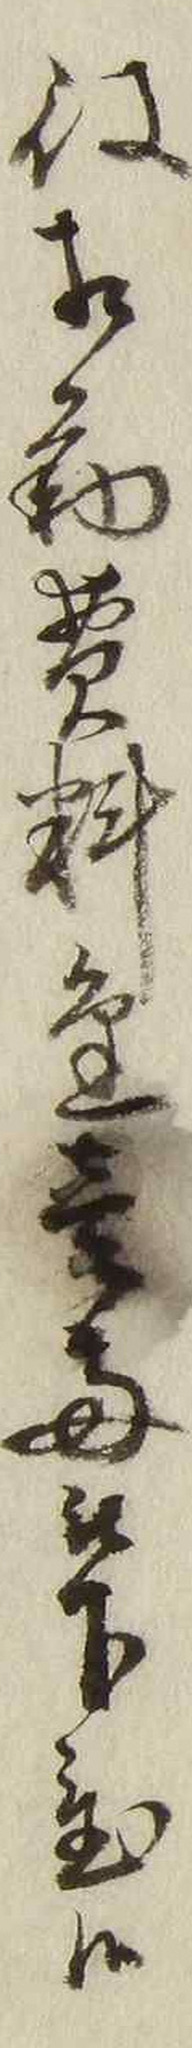役相勤費料金壱両被下置候

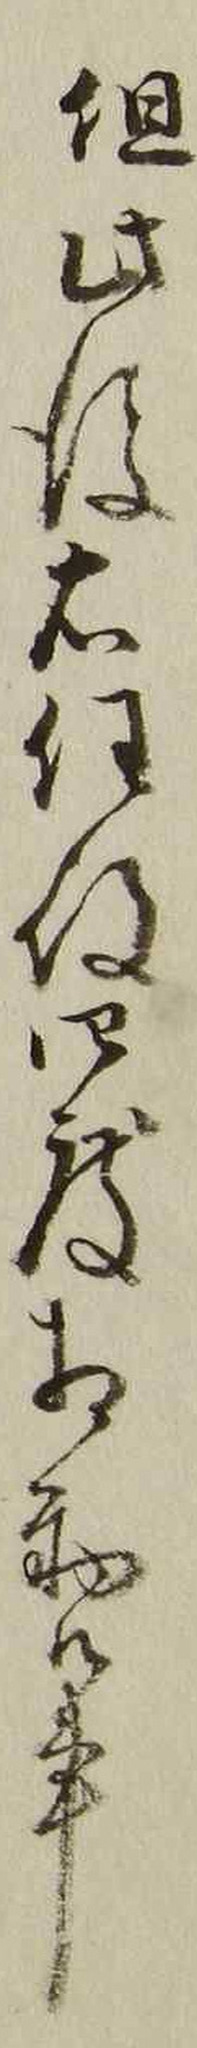但此後右任役四度相勤候事
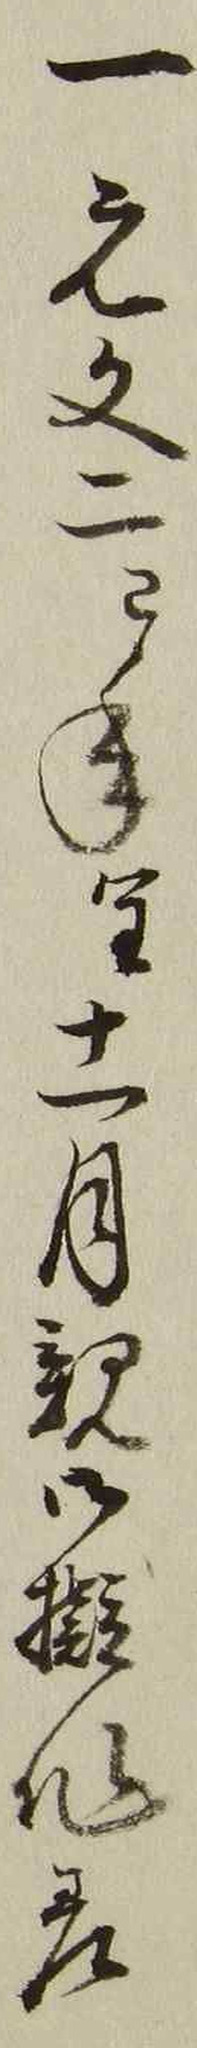一元文二巳年閏十一月親御擬作差
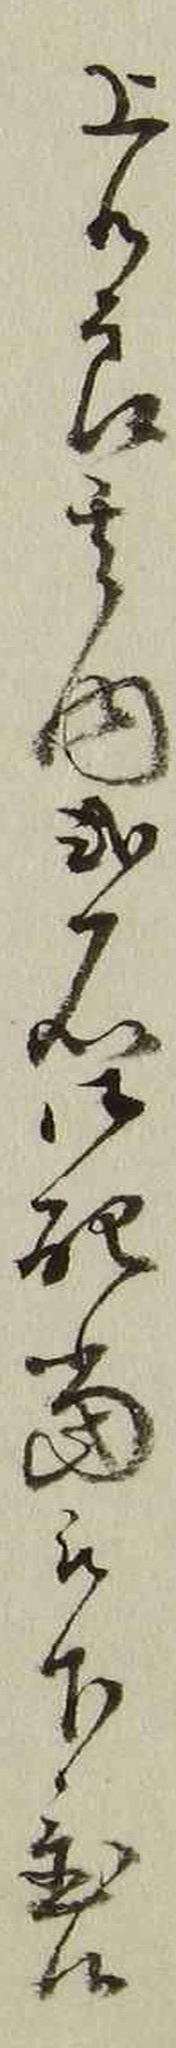上候節其内弐石御配当被下置候
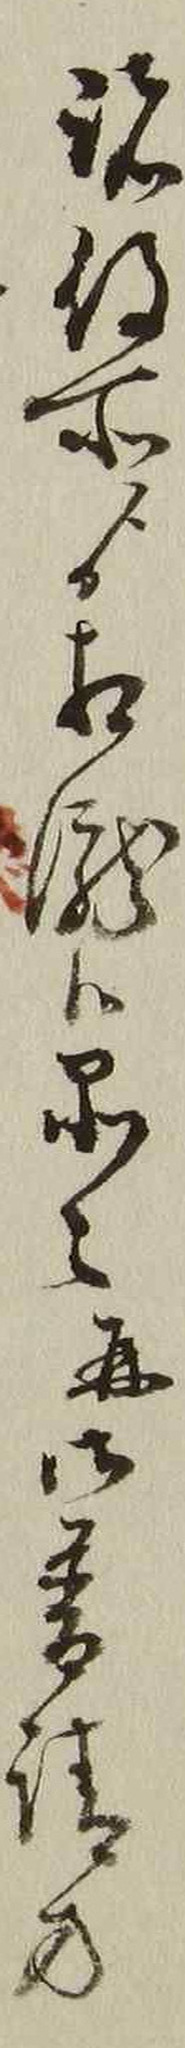諸役所ゟ相渡候品々并御普請方
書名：諸士系譜　巻之36　は之部4
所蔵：会津若松市立会津図書館
